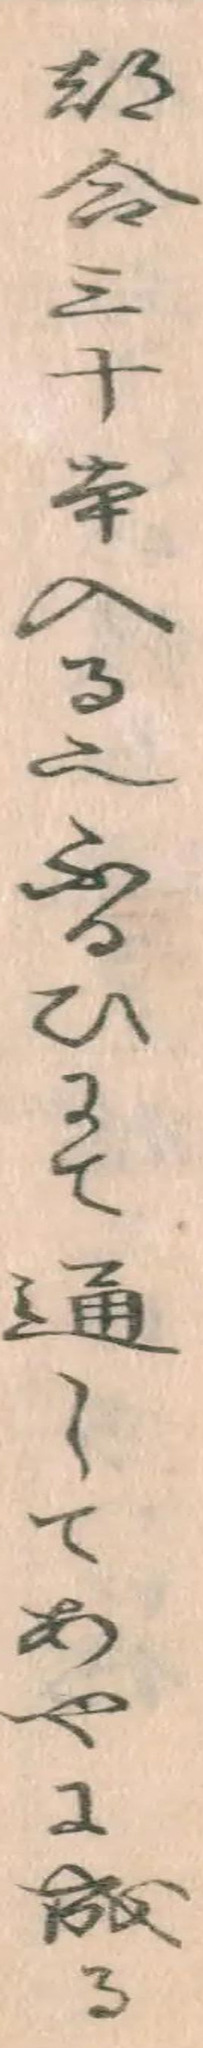都合三十本入る也ふるひにて通してあやに成る
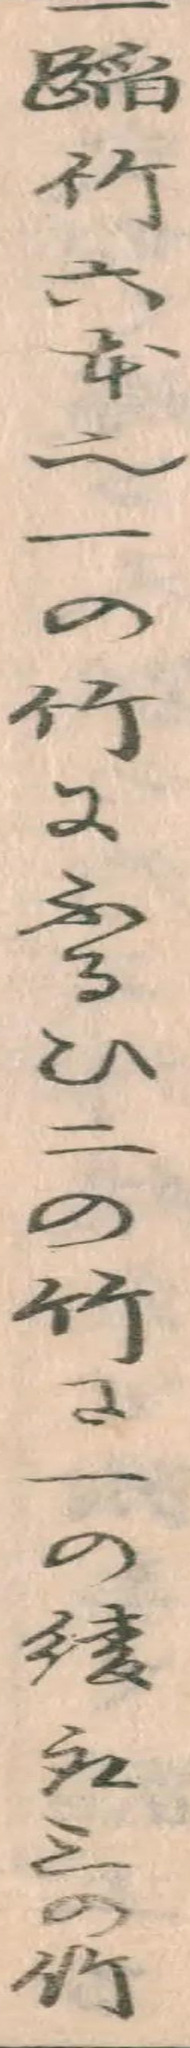一蹈竹六本也一の竹にふるひ二の竹に一の綾取三の竹
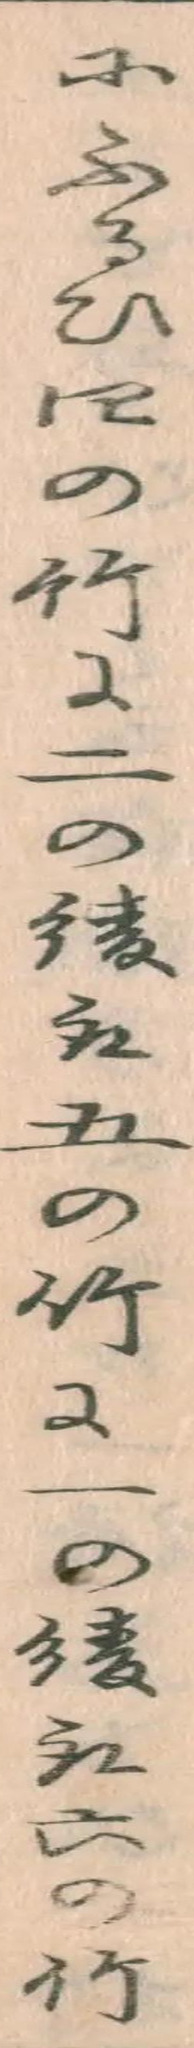にふるひ四の竹に二の綾取五の竹に一の綾取六の竹
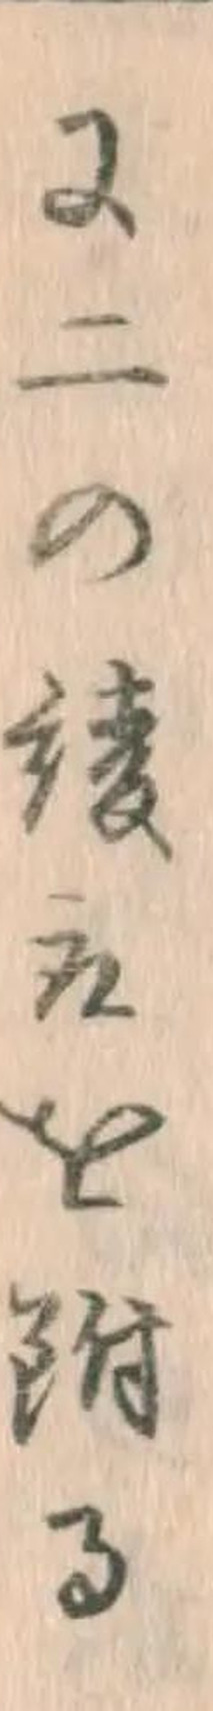に二の綾取を附る
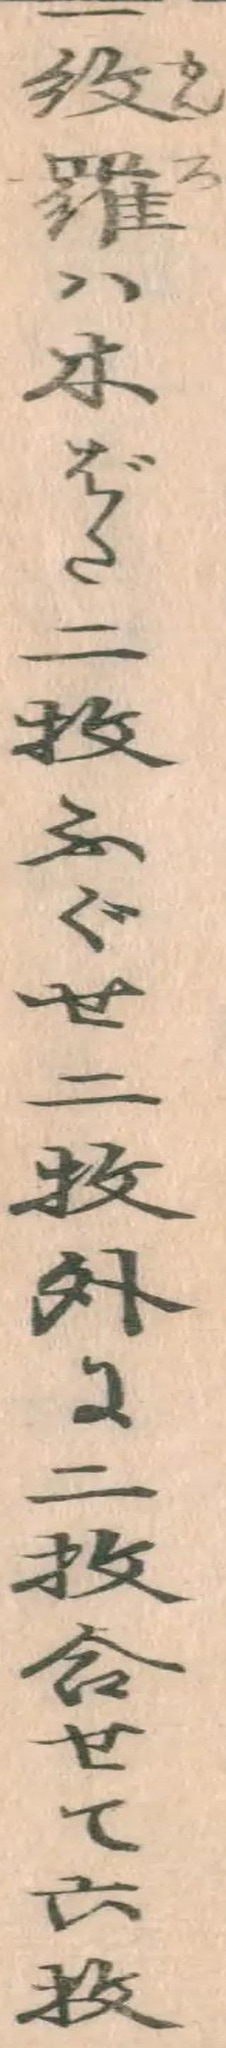一紋羅は木ばた二枚ふぐせ二枚外に二枚合せて六枚
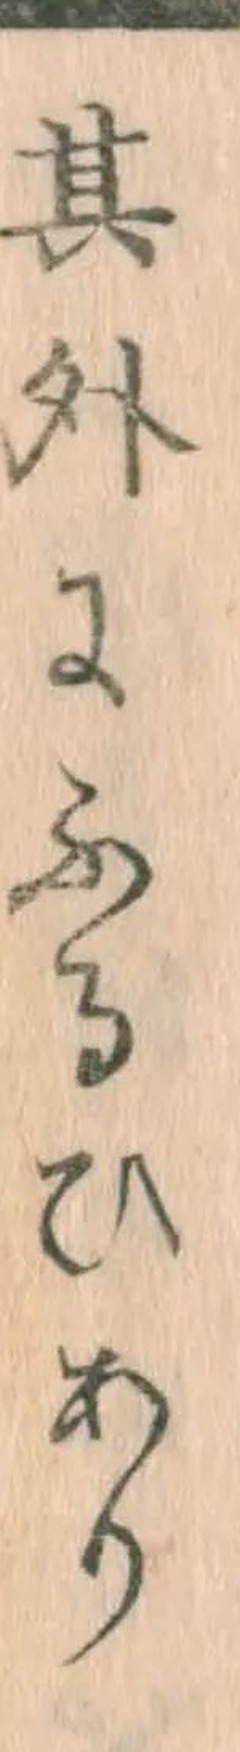其外にふるひあり
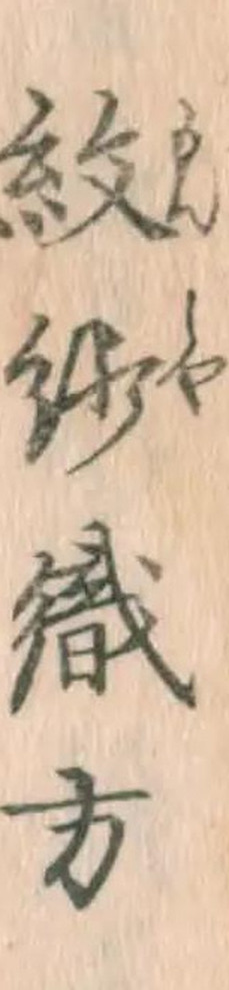紋紗織方
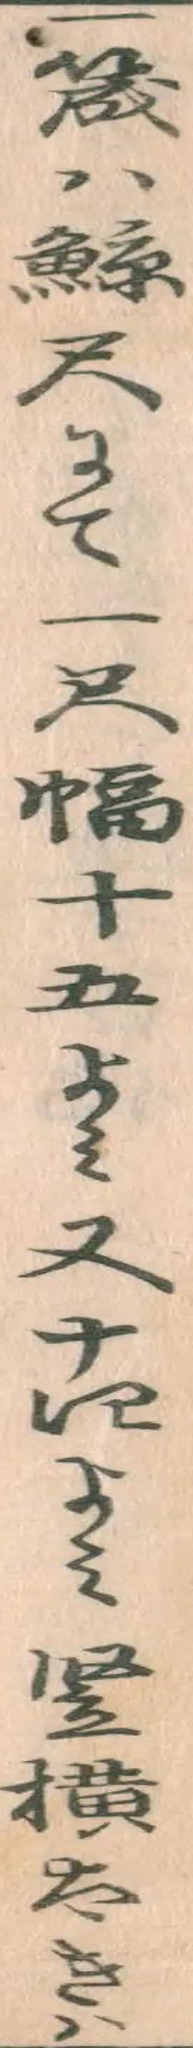一筬は鯨尺にて一尺幅十五よみ又十四よみ竪横太きは
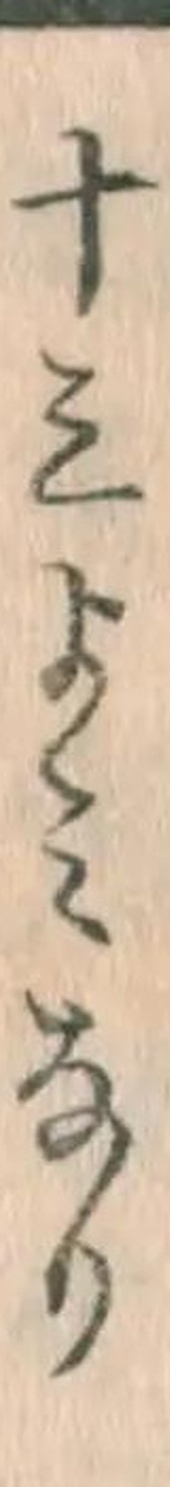十三よみなり
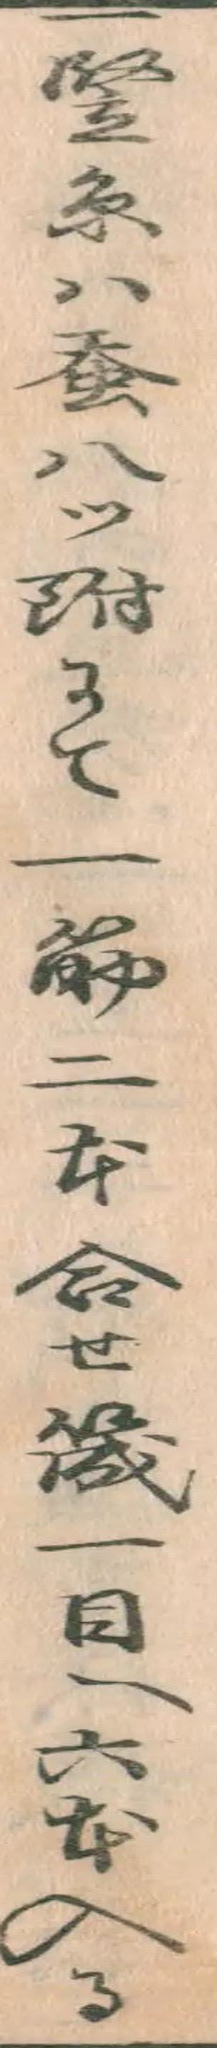一竪糸は蚕八ッ附にて一筋二本合せ筬一目へ六本入る
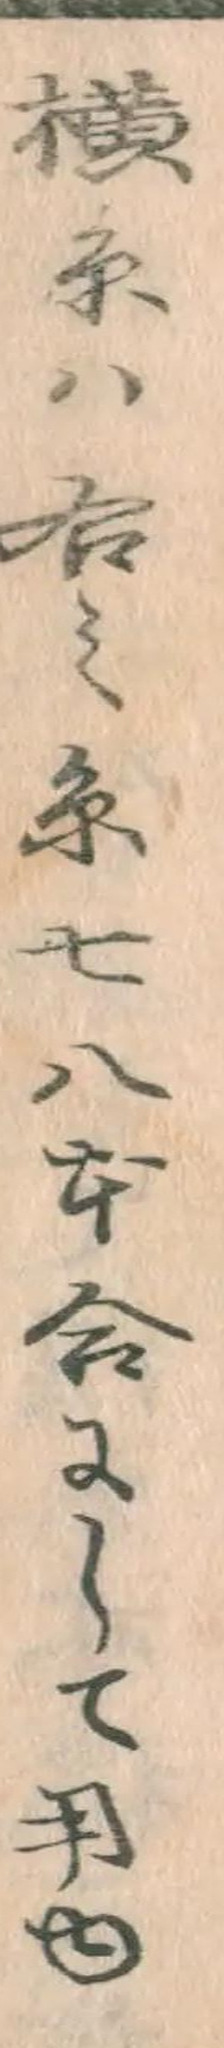横糸は右之糸七八本合にして用ゆ

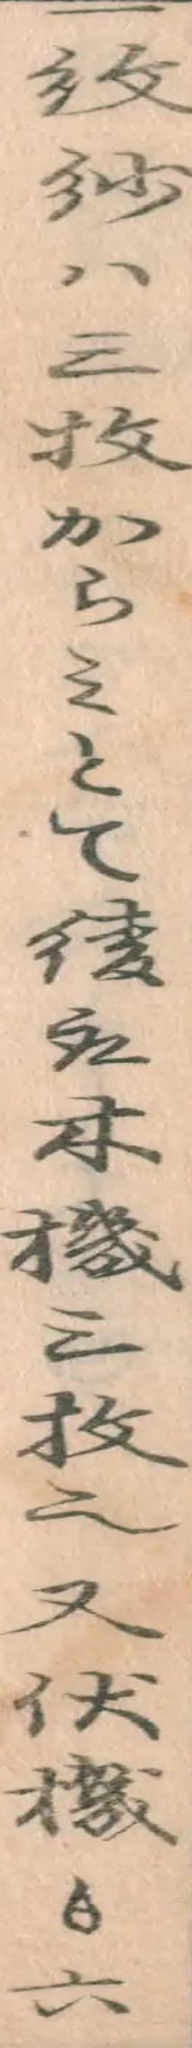一紋紗は三枚からみとて綾取木機三枚也又伏機も六
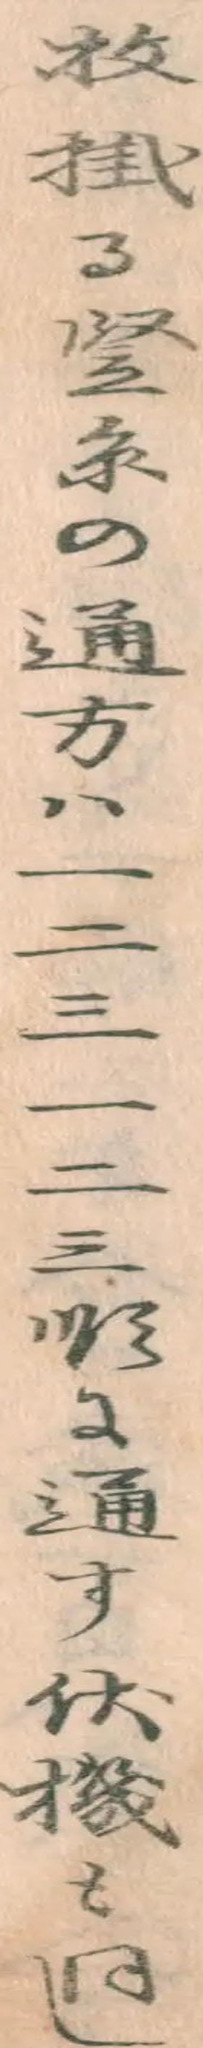枚掛る竪糸の通方は一二三一二三順に通す伏機も同し
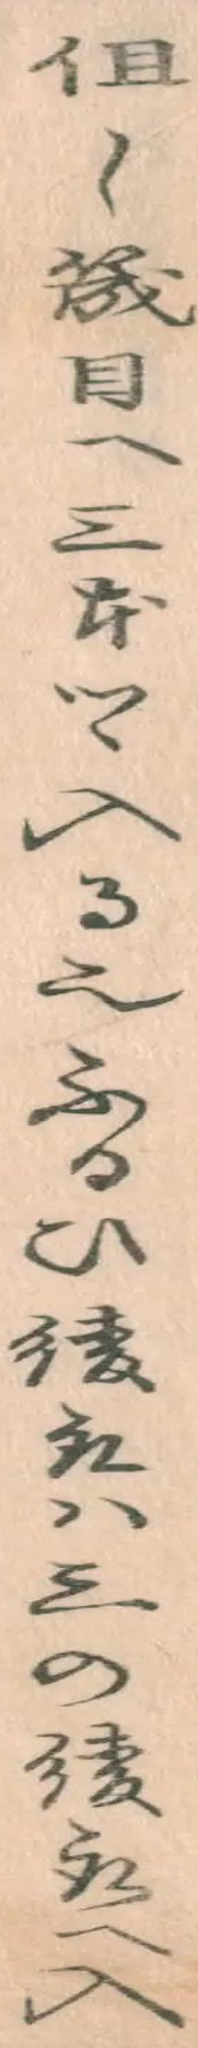但し筬目へ三本つゝ入る也ふるひ綾取は三の綾取へ入
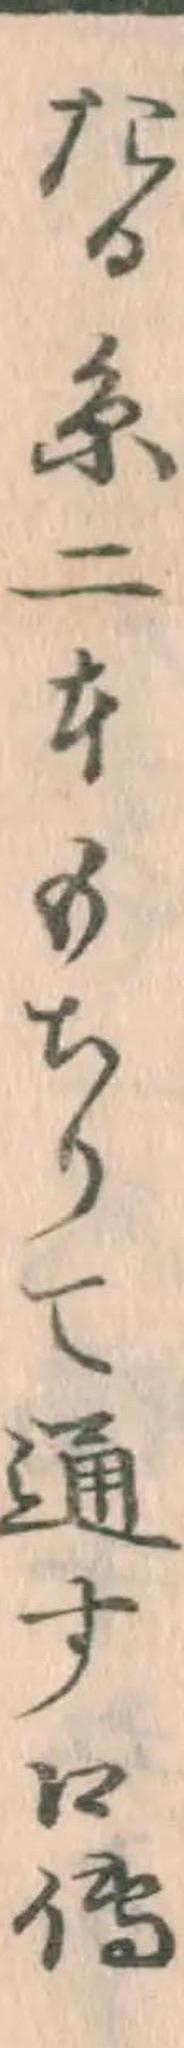たる糸二本もちりて通す口伝
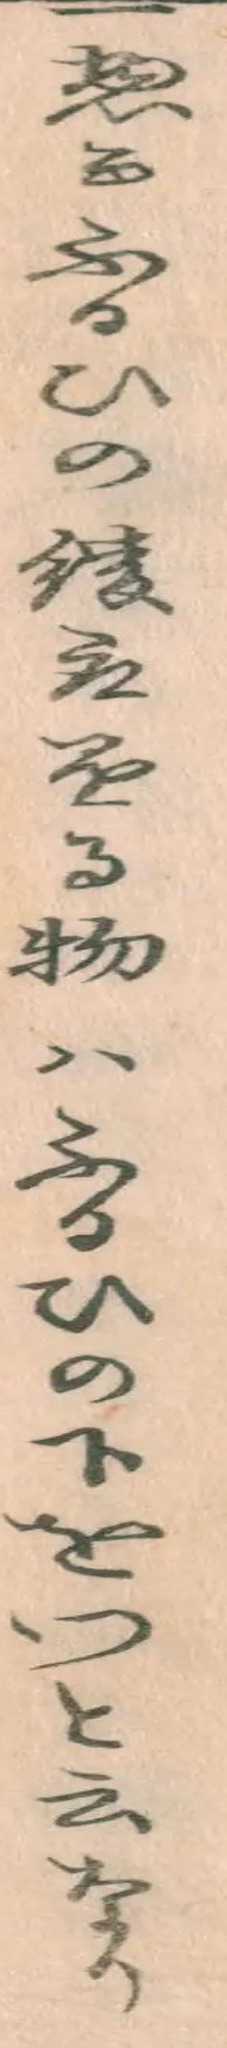一惣てふるひの綾取懸る物はふるひの下をつと云なり
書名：機織彙編 5巻. [2]
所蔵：国立国会図書館 National Diet Library, JAPAN
